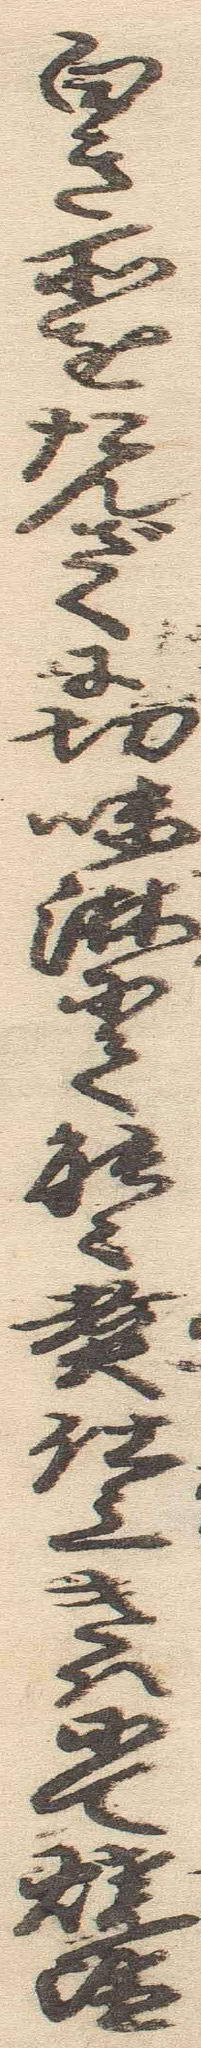白き所をたんざくに切味淋にて能々煮仕上きはにて焼塩
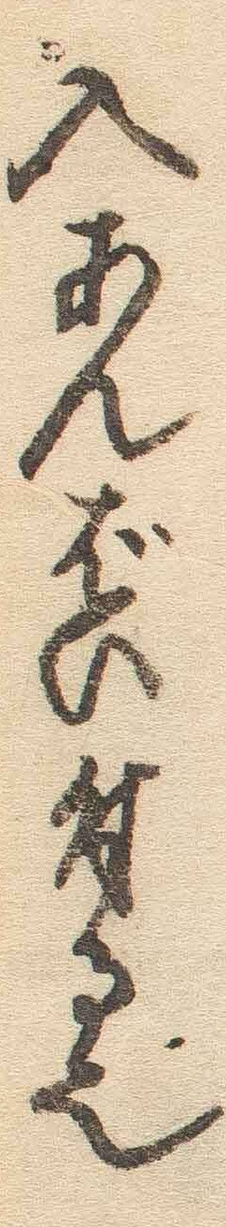入あんばい付る也

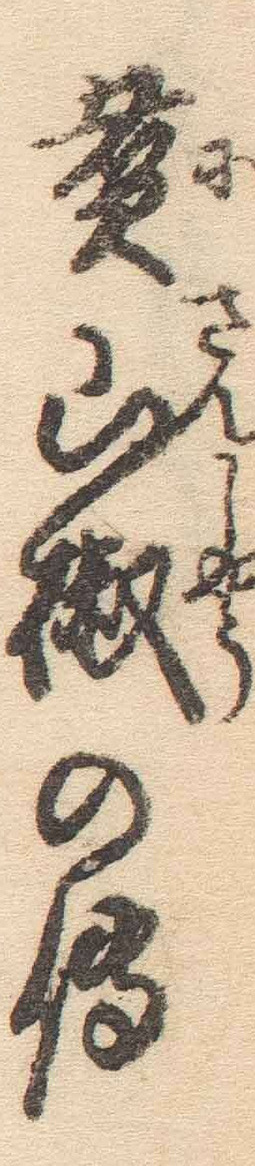煮山椒の伝
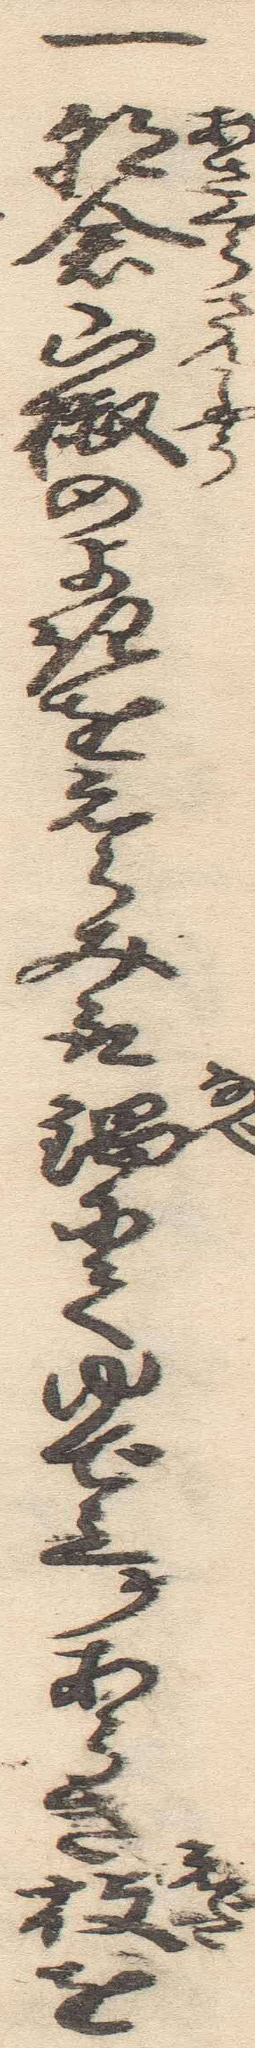一朝倉山椒のよきをえらみ取鍋にてゆで上枝を
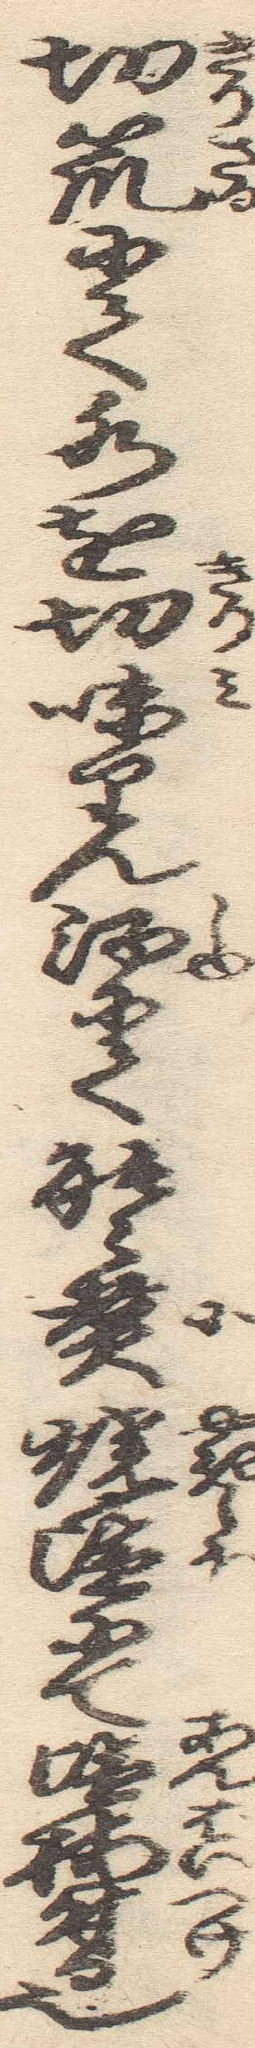切笊にて水を切味りん酒にて能々煮焼塩にて塩梅付る也
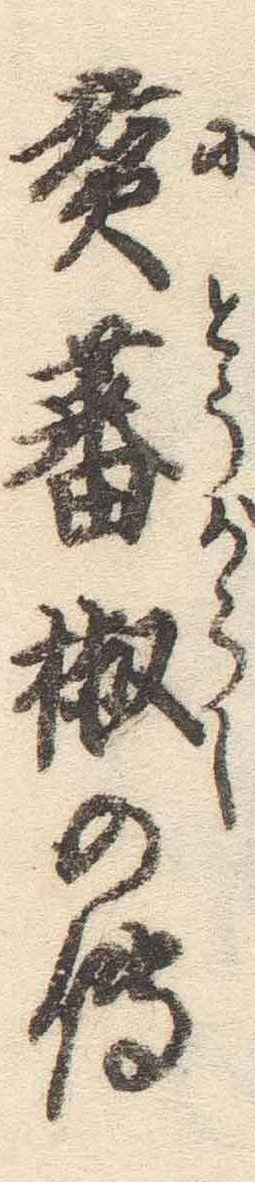煮蕃椒の伝
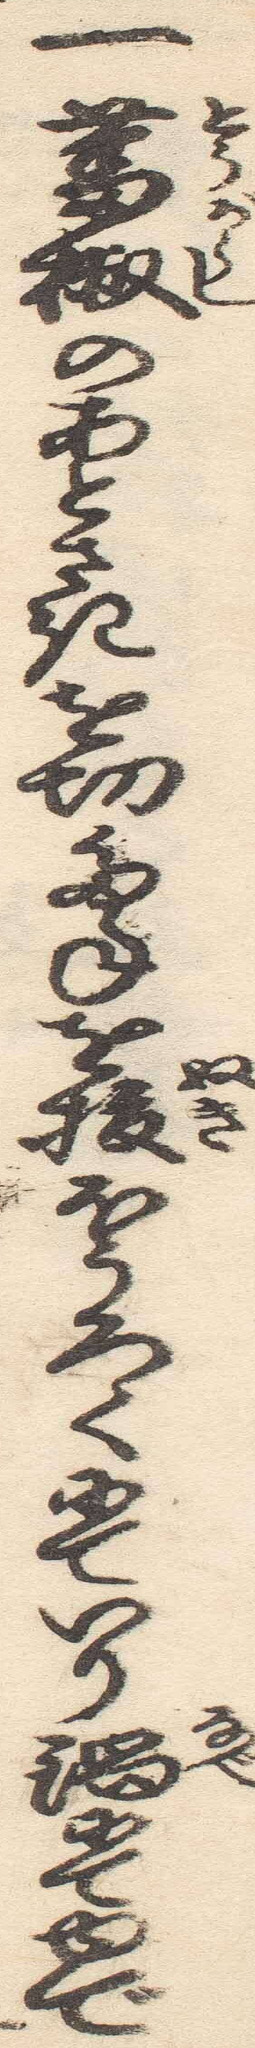一蕃椒のあとさきを切たねを抜ほうろくにていり鍋にてゆで
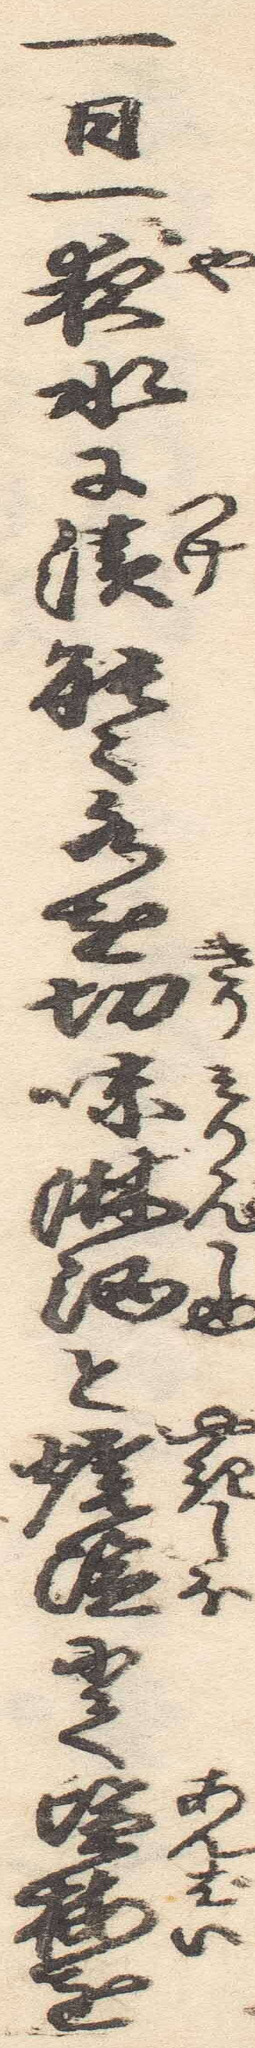一日一夜水に漬能々水を切味淋酒と焼塩にて塩梅を
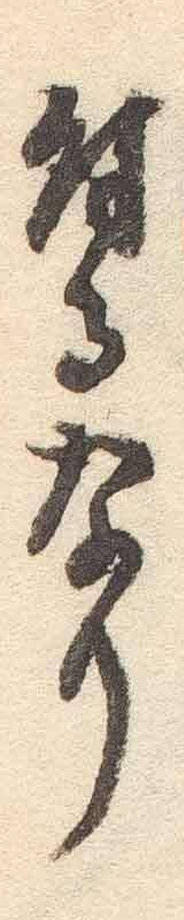付るなり
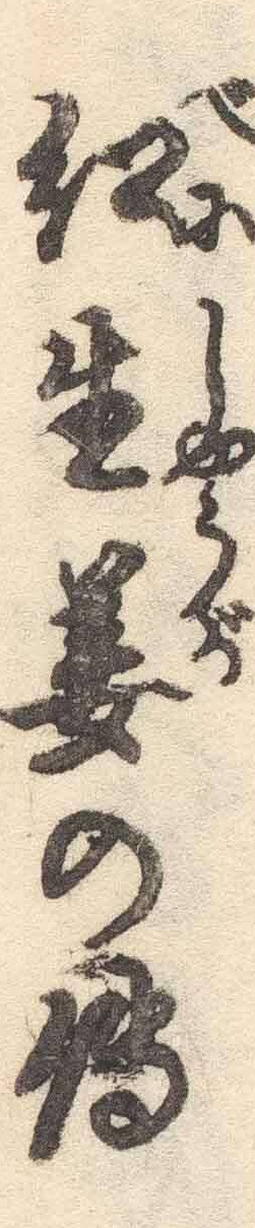紅生姜の伝
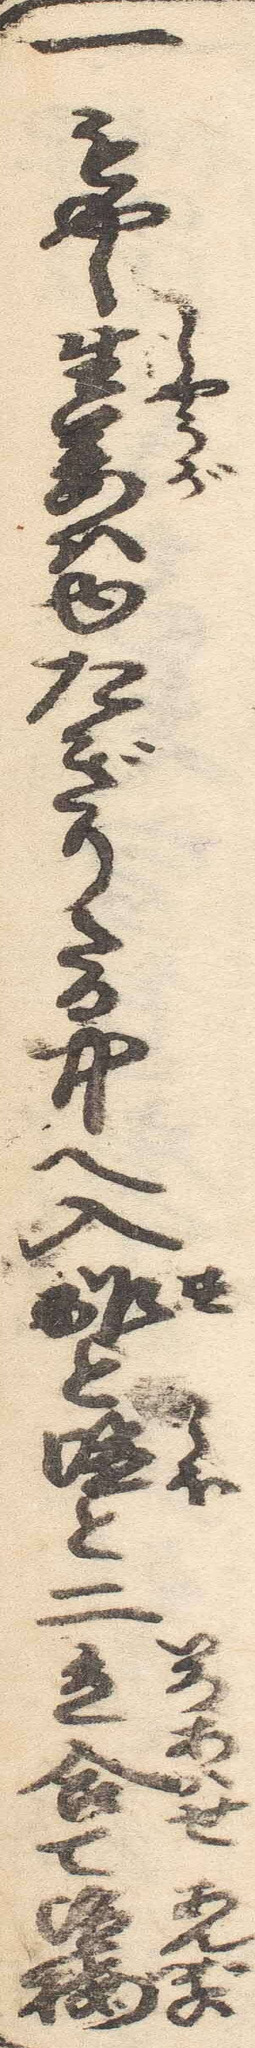一もやし生姜はゆたぎりたる中へ入酢と塩と二色合て塩梅
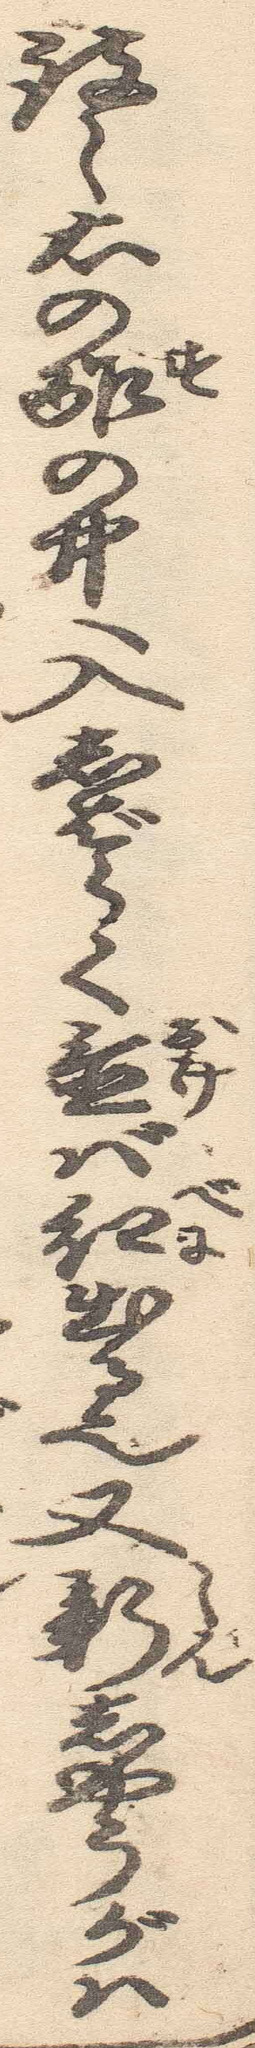致し右の酢の中へ入しばらく置ば紅出る也又新しやうがは
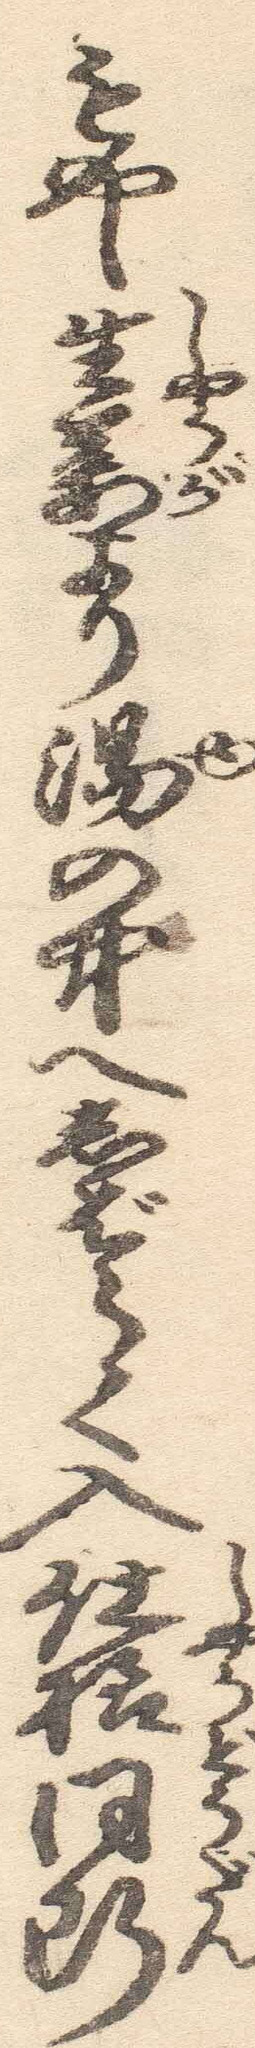もやし生姜より湯の中へしばらく入仕様同断
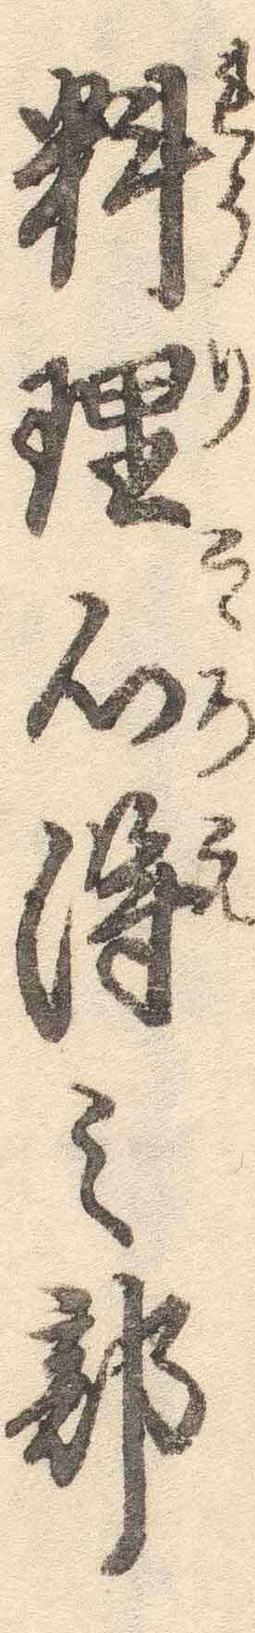料理心得之部
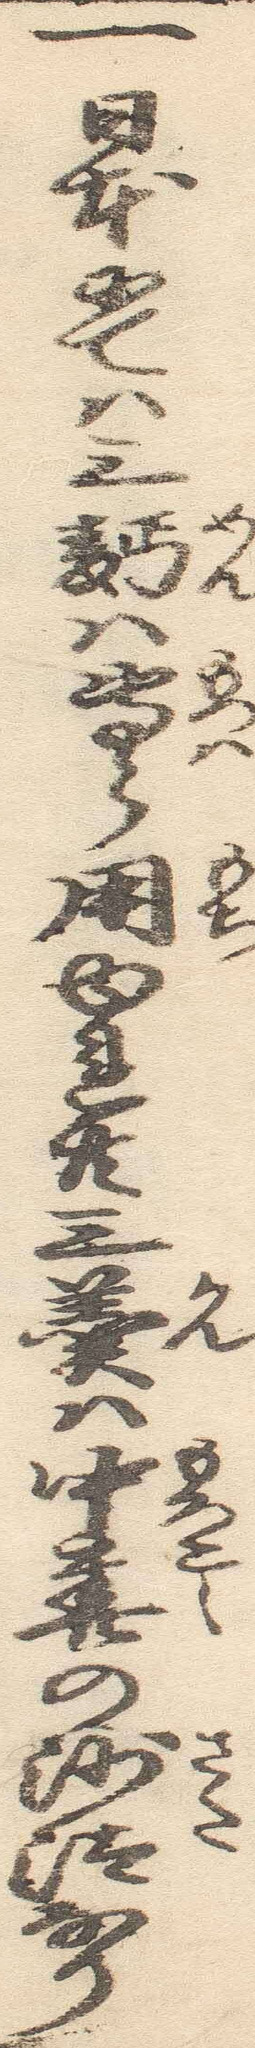一日本にては三麺は専ら用ゆれ共三羹は中華の沙汰なり
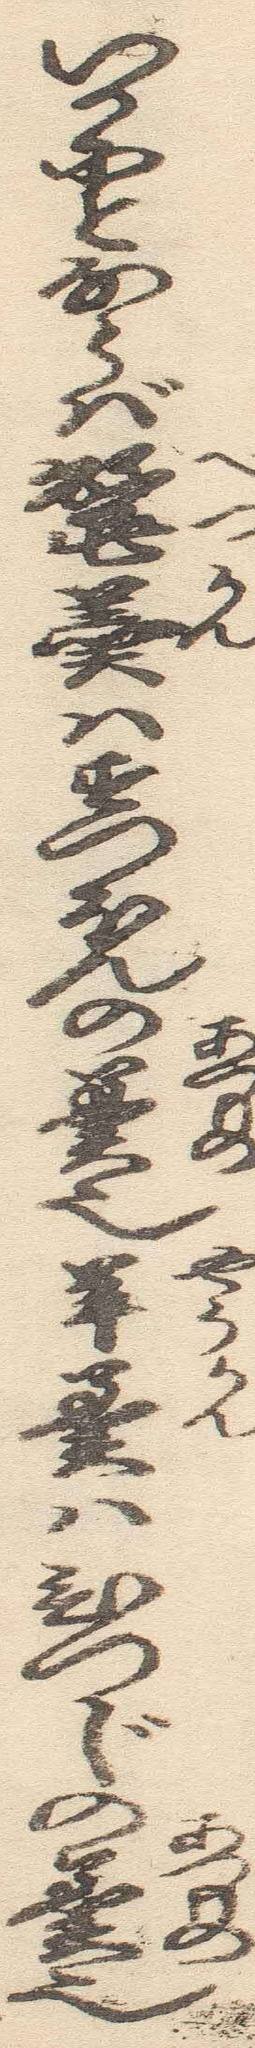いかにとならば鼈羹はすつほんの羹也羊羹はひつじの羹也
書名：料理通
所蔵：東京学芸大学附属図書館 国文学研究資料館
